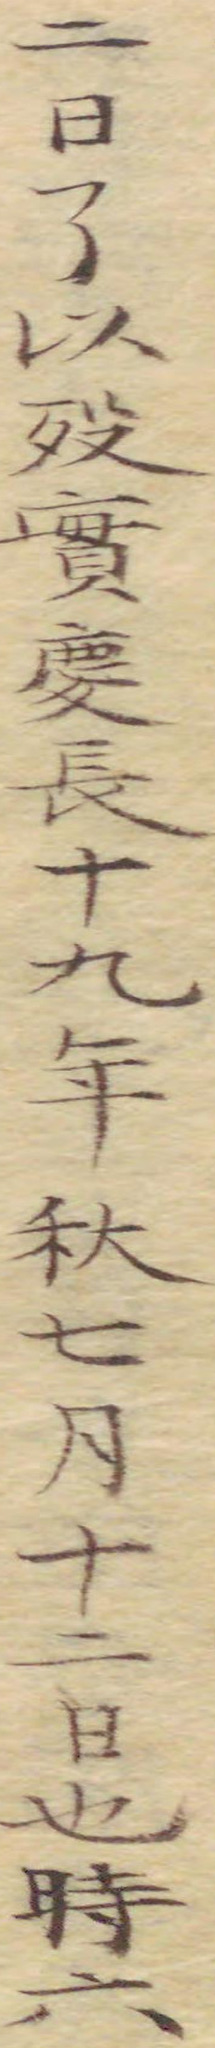二日了以歿実慶長十九年秋七月十二日也時六
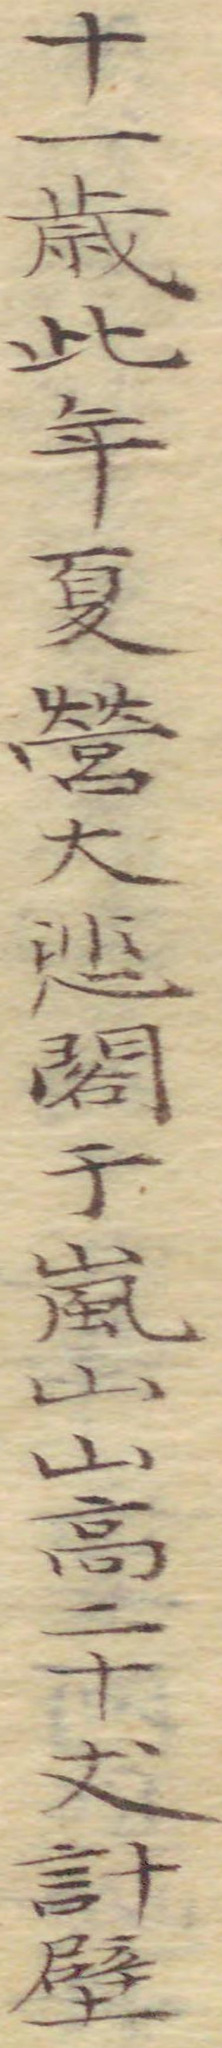十一歳此年夏営大悲閣于嵐山山高二十丈計壁
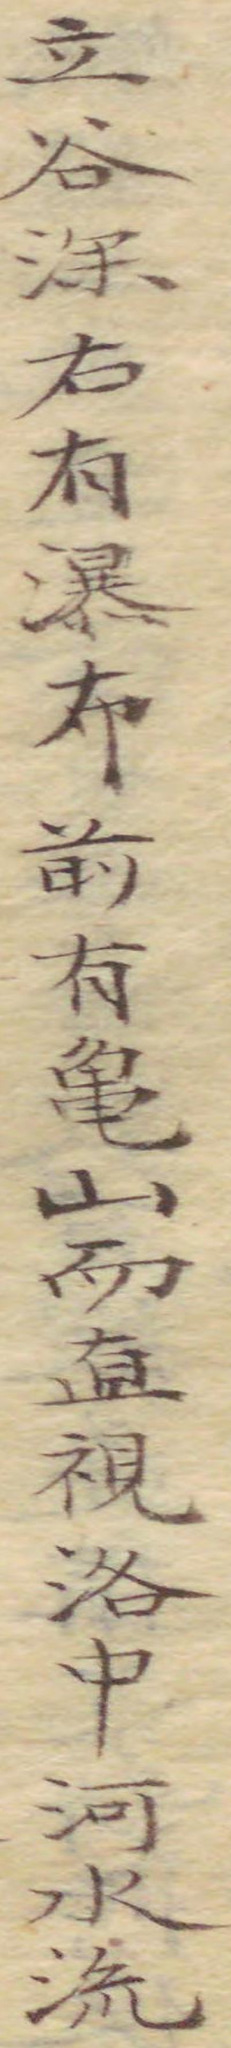立谷深右有瀑布前有亀山而直視洛中河水流
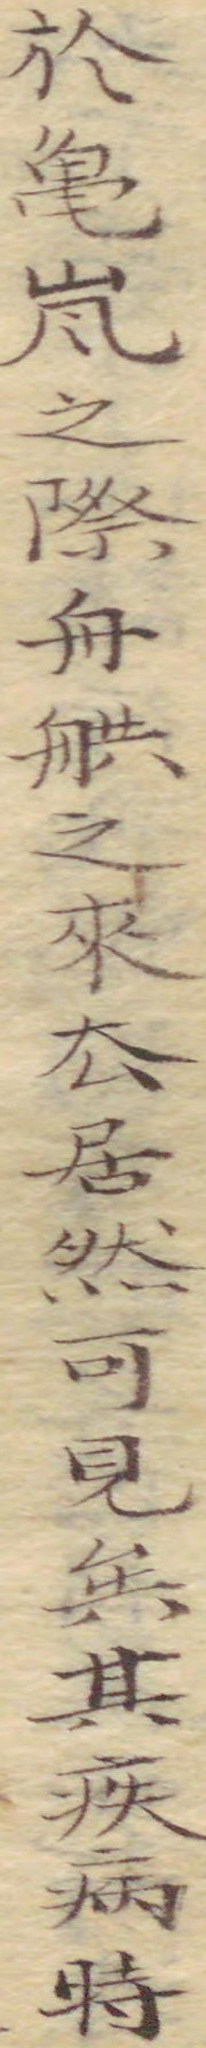於亀嵐之際舟舼之来去居然可見矣其疾病時
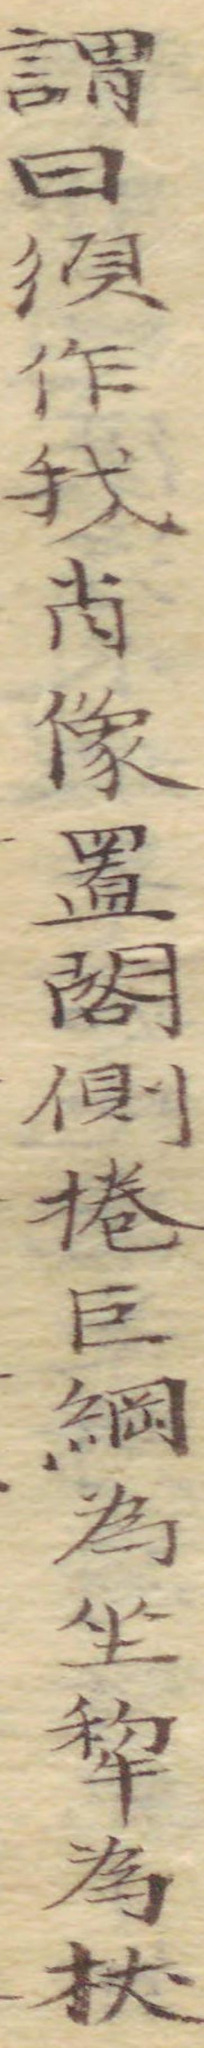謂曰須作我肖像置閣側捲巨綱為坐犂為杖
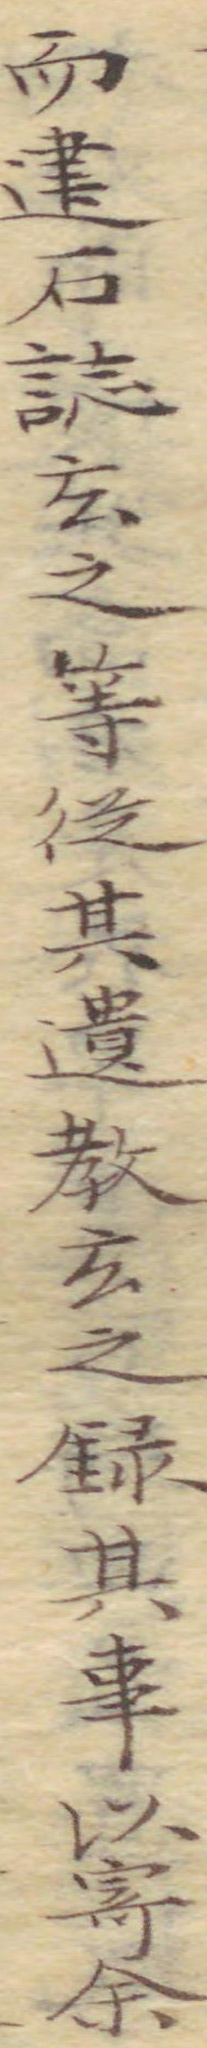而建石誌玄之等従其遺教玄之録其事以寄余
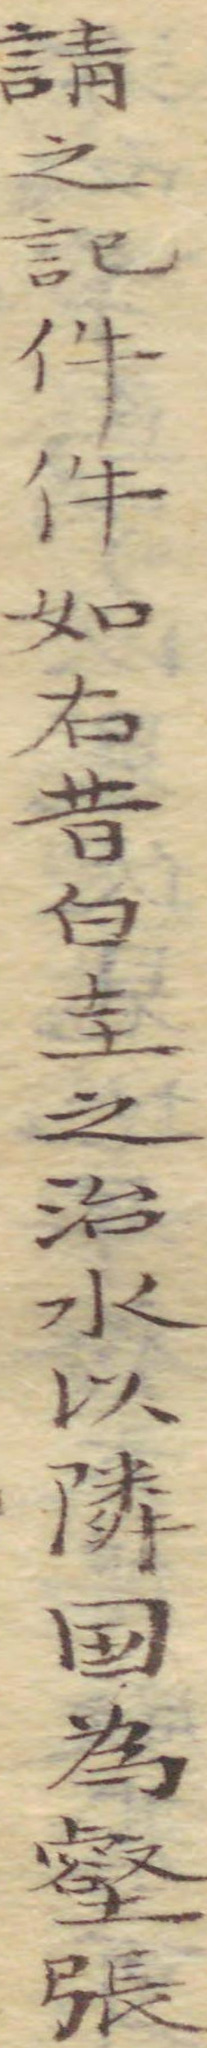請之記件件如右昔白圭之治水以隣国為壑張
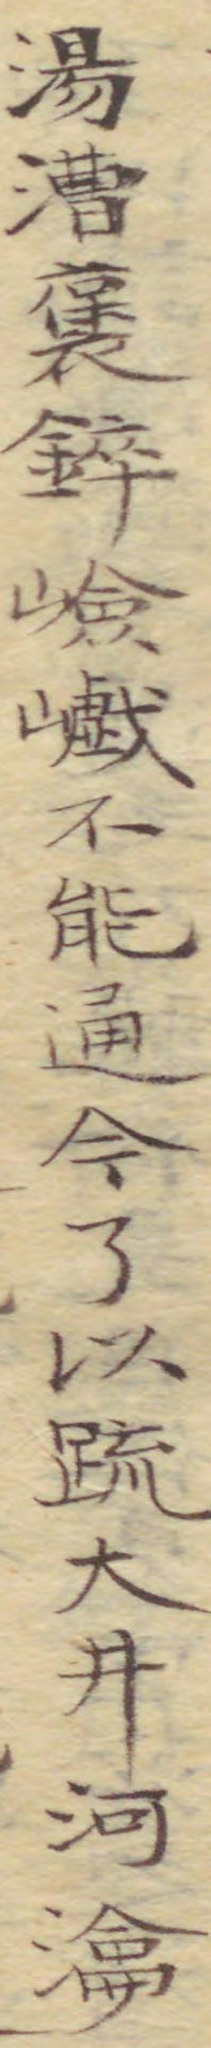湯漕褒錊嶮巇不能通今了以䟽大井河瀹
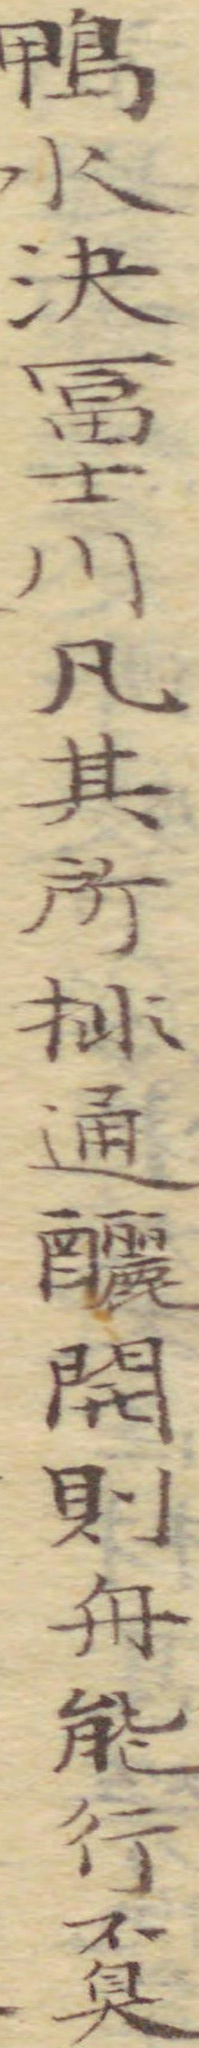鴨水決冨士川凡其所排通釃開則舟能行不臭
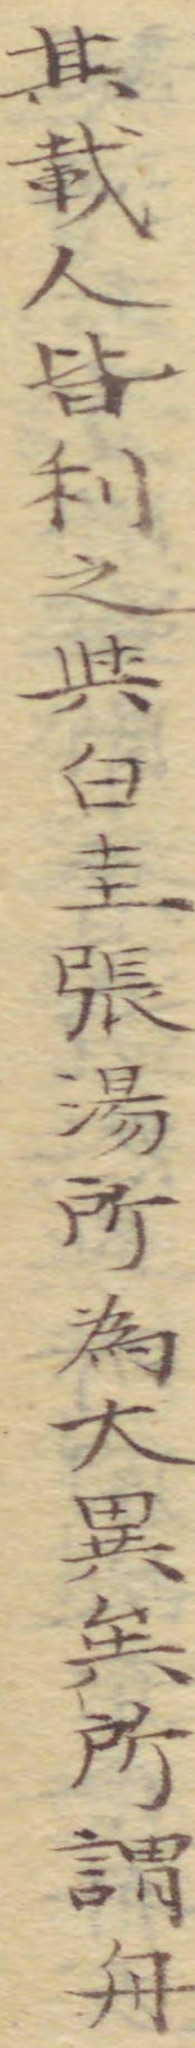其載人皆利之与白圭張湯所為大異矣所謂舟
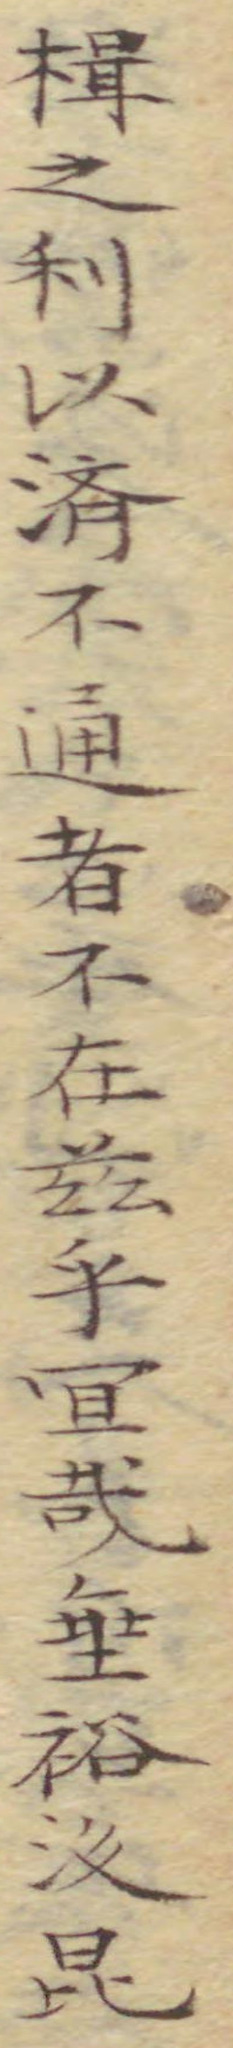楫之利以済不通者不在茲乎宜哉垂裕後昆
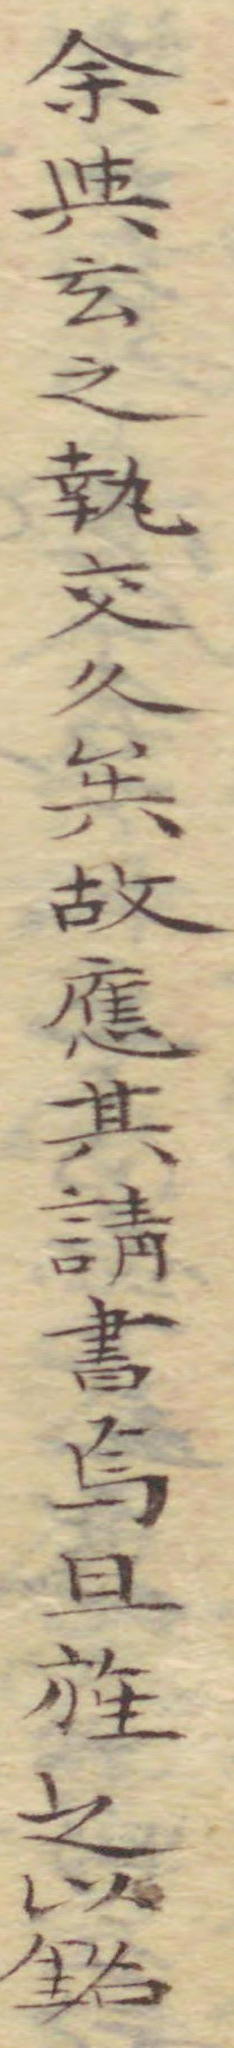余与玄之執交久矣故応其請書焉且旌之以銘
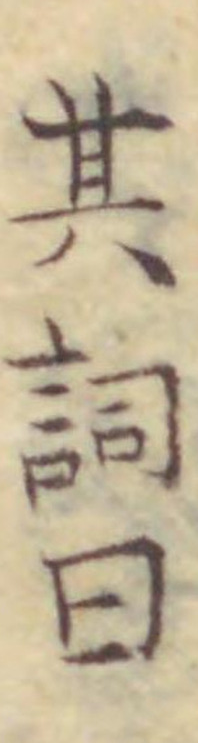其詞曰
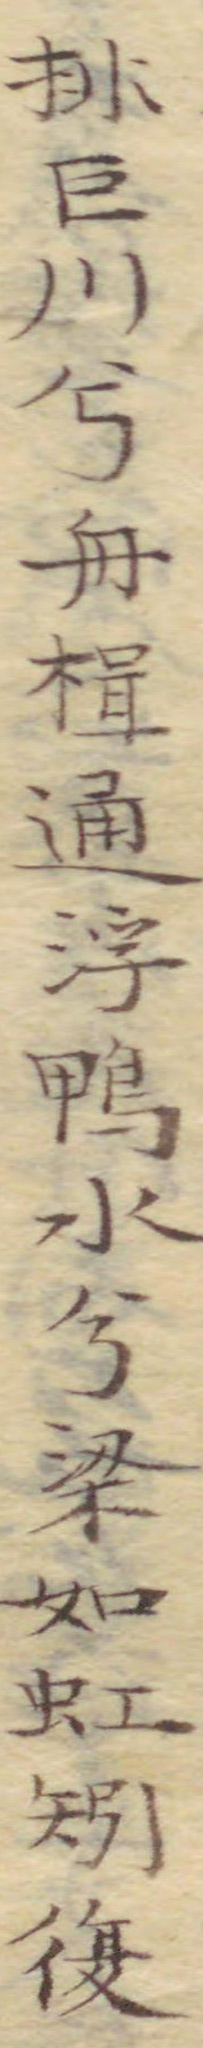排巨川兮舟楫通浮鴨水兮梁如虹矧復
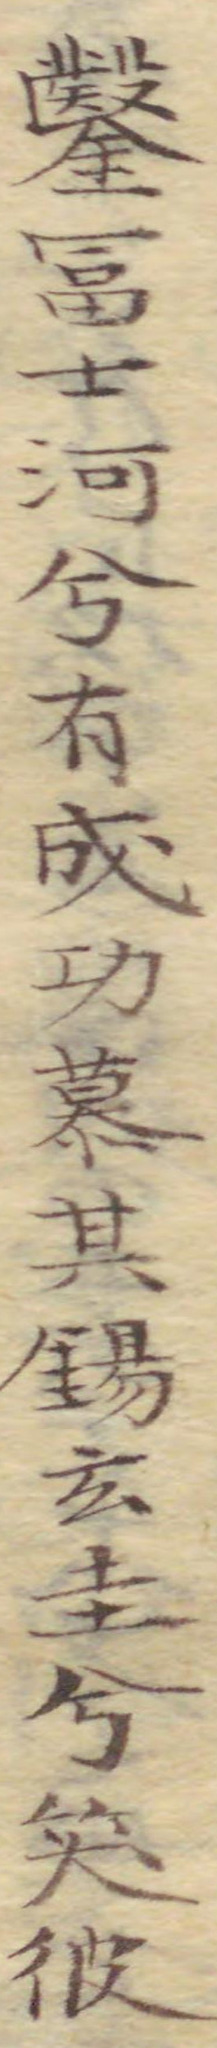鑿冨士河兮有成功慕其錫玄圭兮笑彼
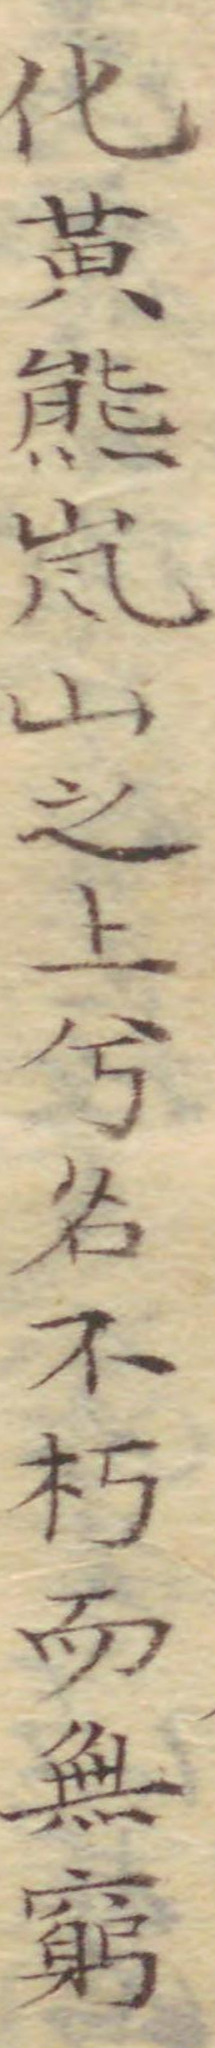化黄熊嵐山之上兮名不朽而無窮
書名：鶯宿雑記. 巻263-264
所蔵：国立国会図書館 National Diet Library, JAPAN
